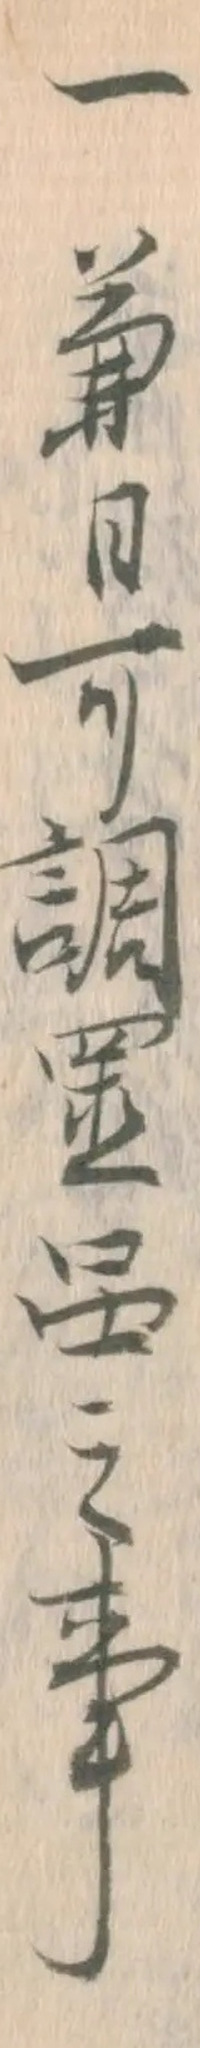一兼日可調置品之事
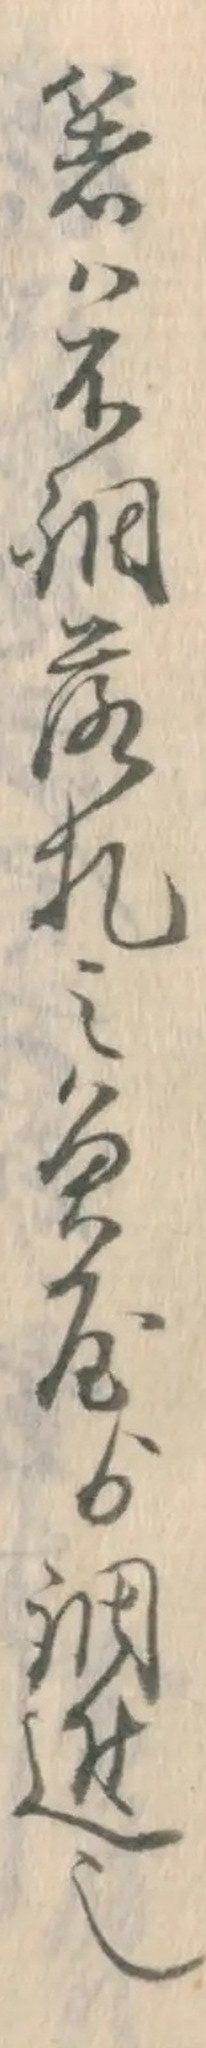箸は不調落札之魚屋ゟ調進也

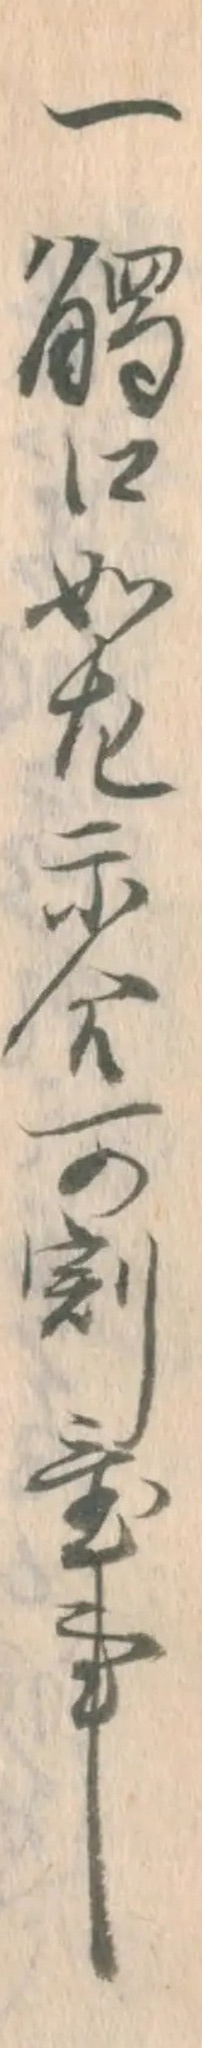一触口如左示合可割置事
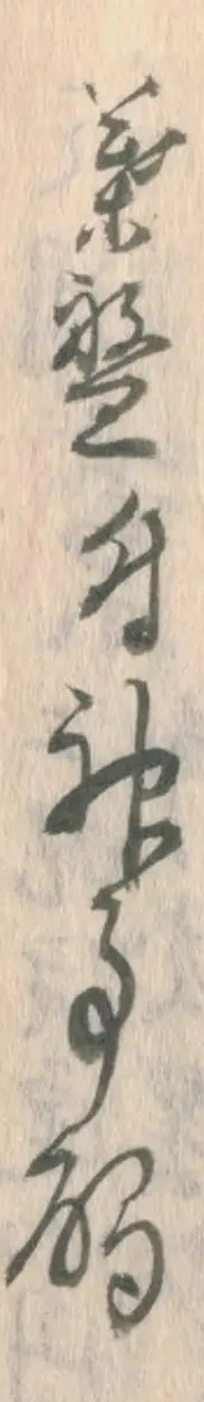葉盤付神事触
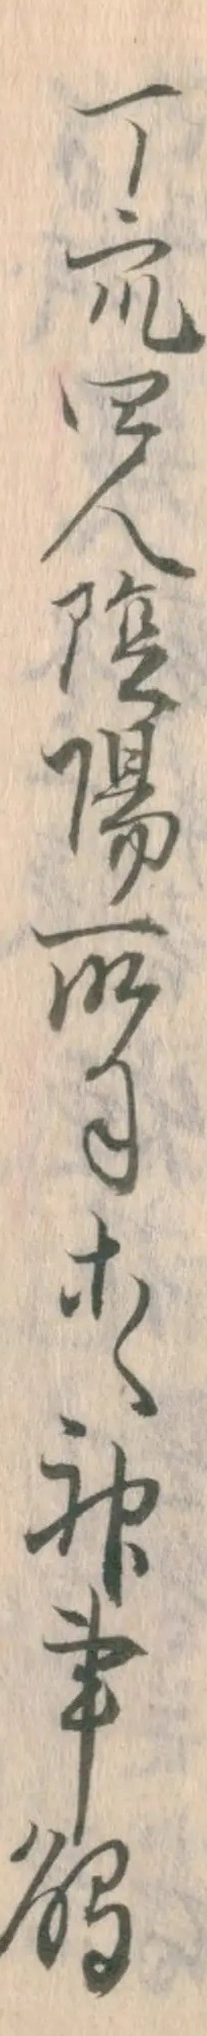丁衆四人陰陽所司等へ神事触
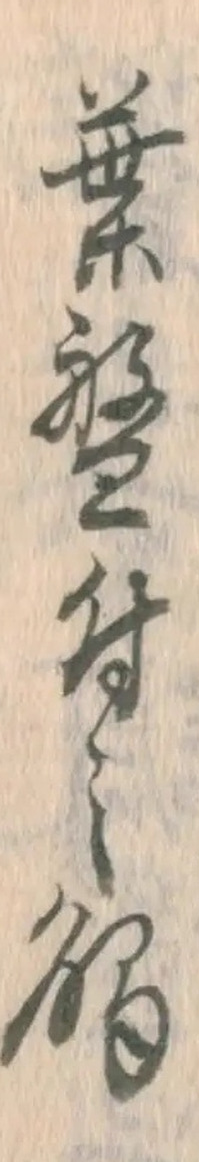葉盤付之触
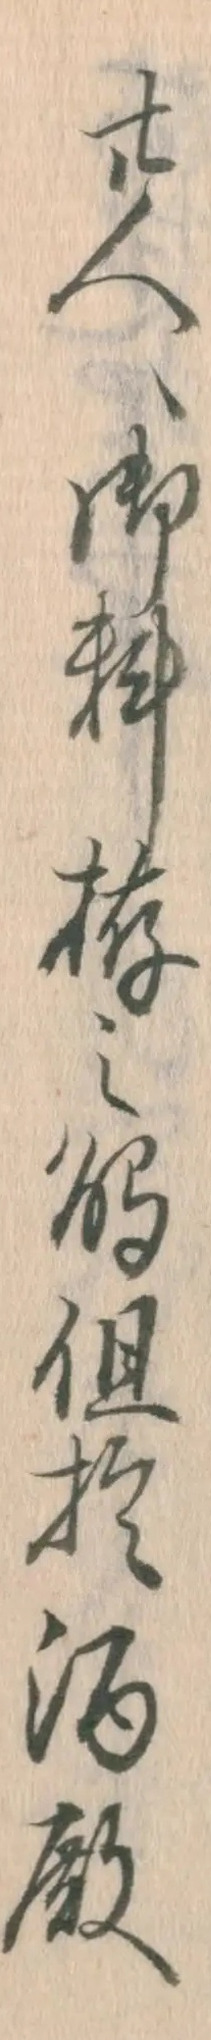廿人へ御料拵之触但於酒殿
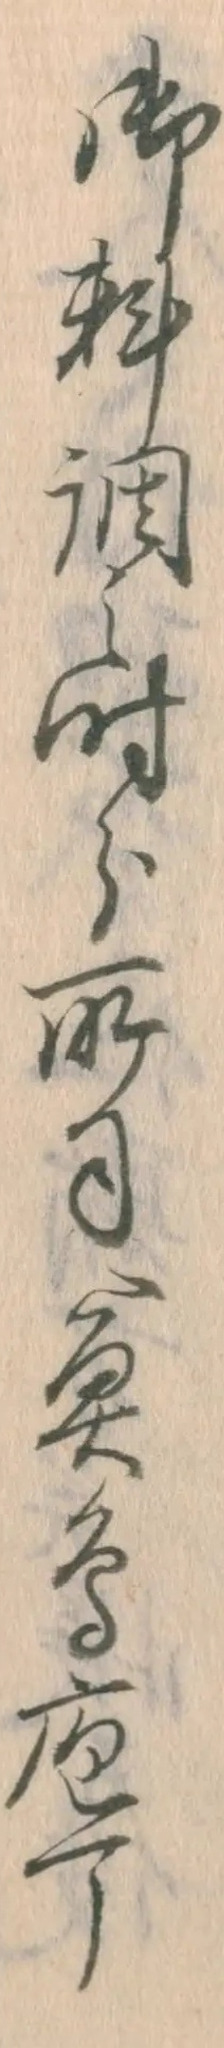御料調之時分所司へ魚鳥庖丁
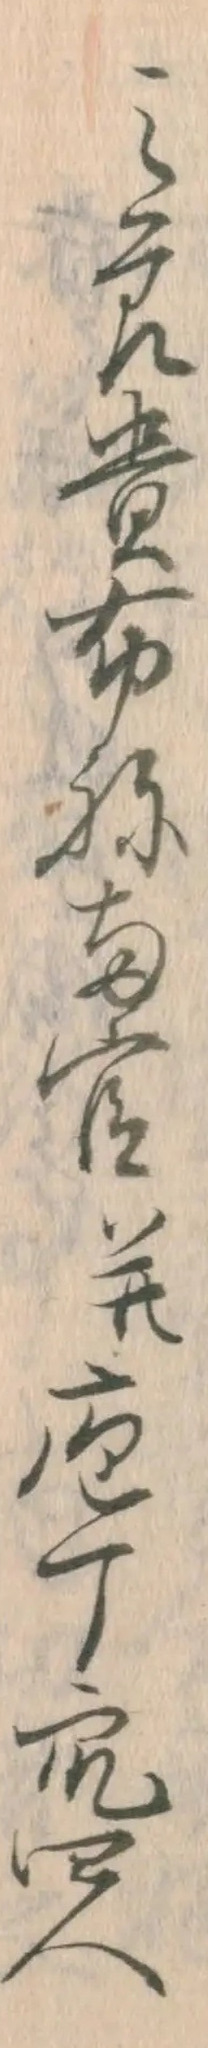之節貴布祢両官并包丁衆四人
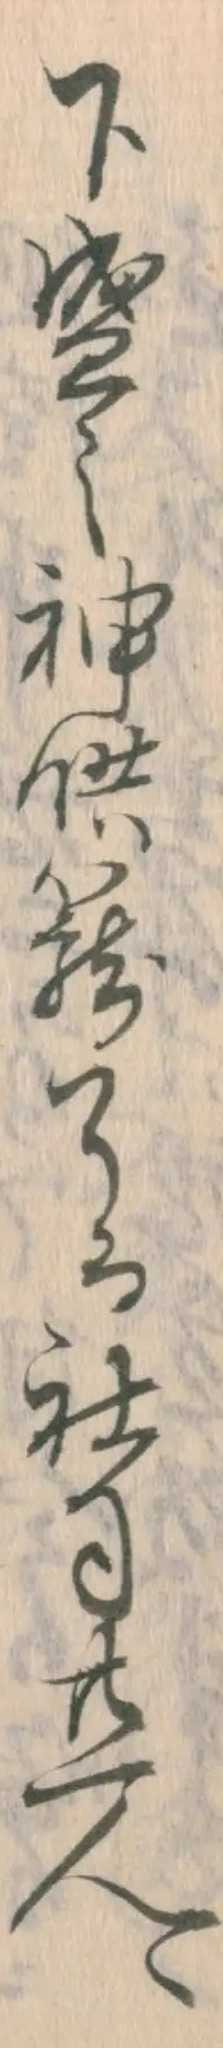下盛之神供籠了而社司廿一人へ
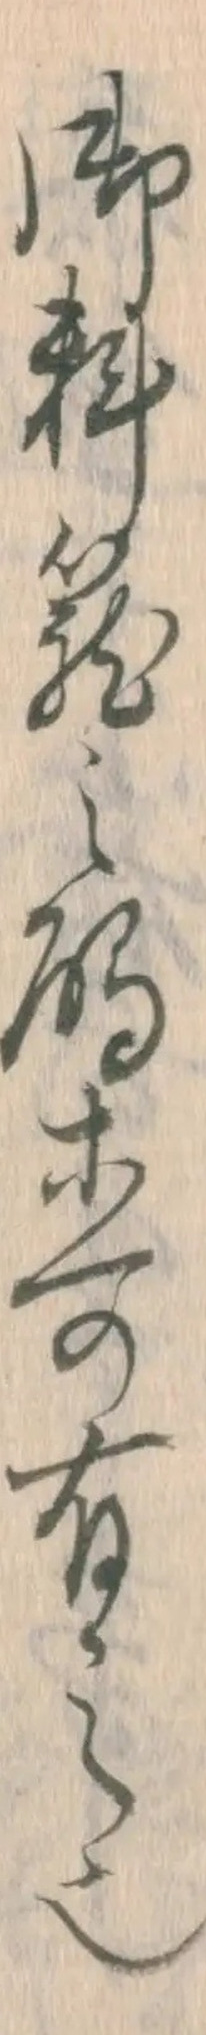御料籠之触等可有之也
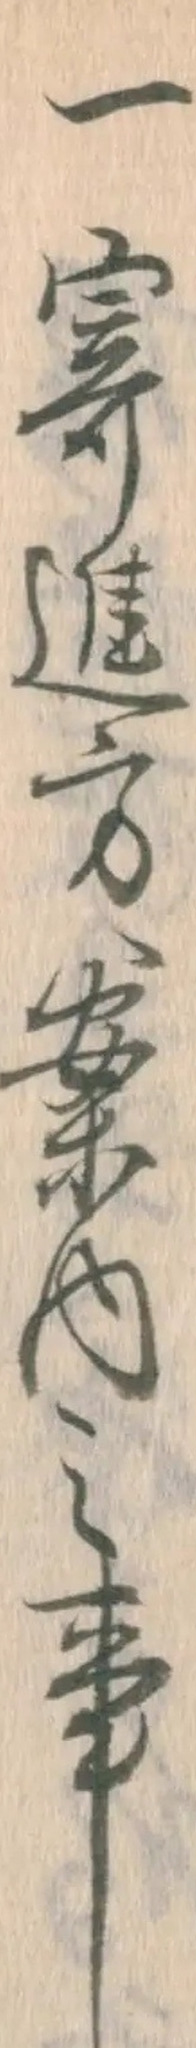一寄進方へ案内之事
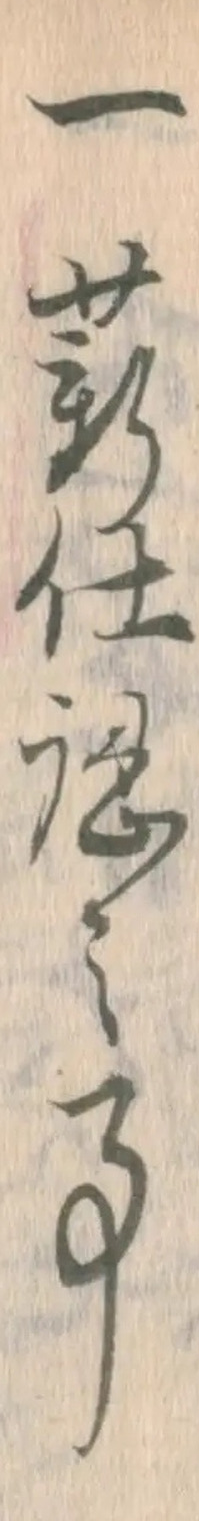一薪仕認之事
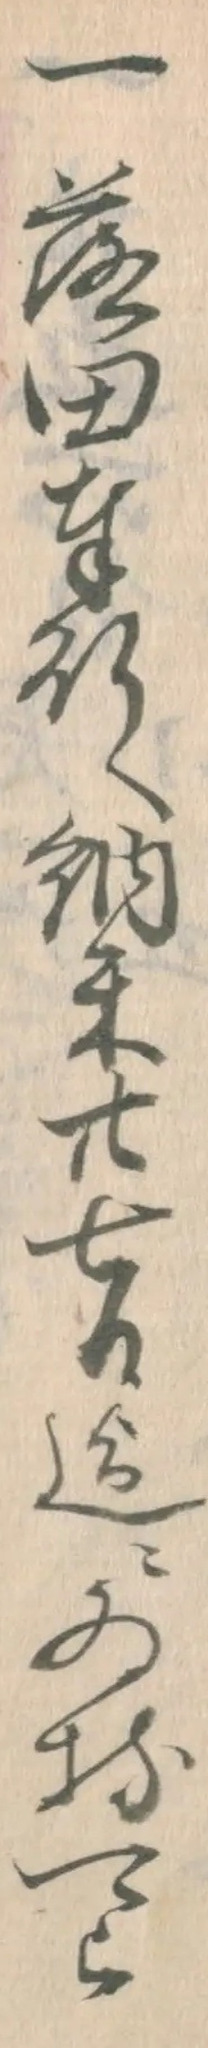一落田奉行へ納米廿七日迄ニ為持可被

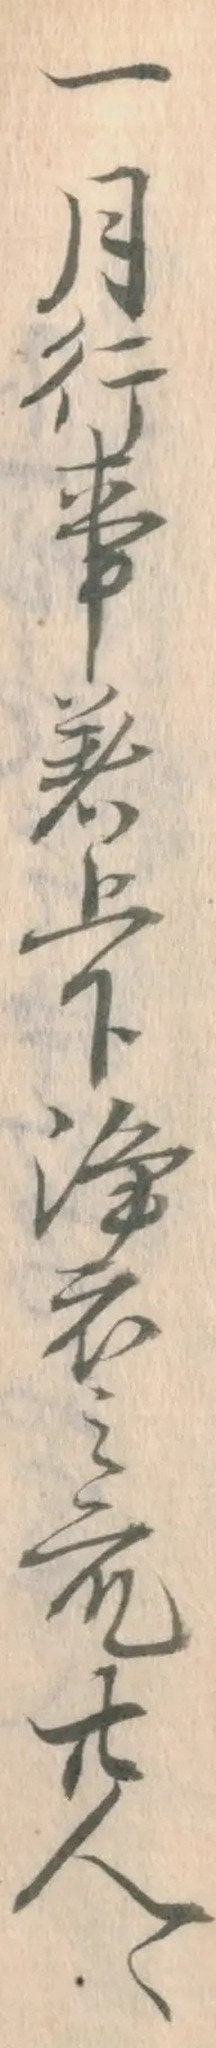一月行事着上下浄衣之衆廿人へ
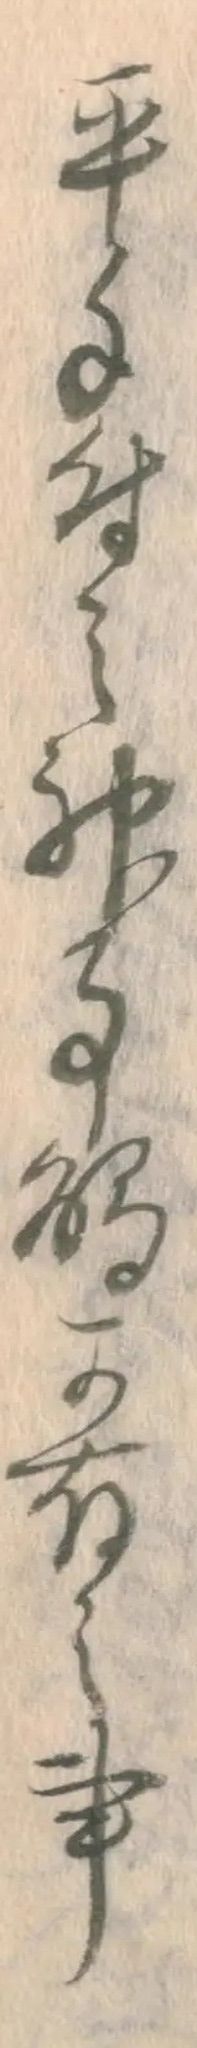平手付之神事觸可有之事
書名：賀茂社記録. 第81冊
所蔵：国立国会図書館 National Diet Library, JAPAN
